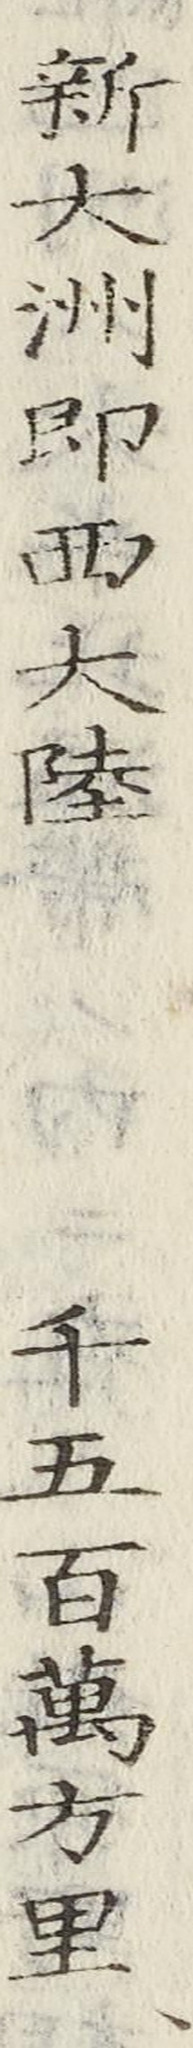新大洲即西大陸千五百万方里、
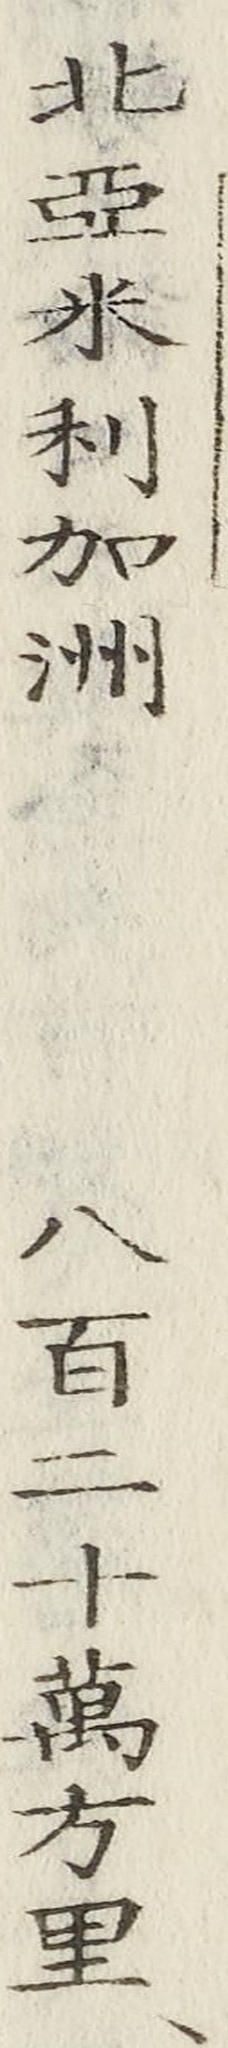北亜米利加洲八百二十万方里、
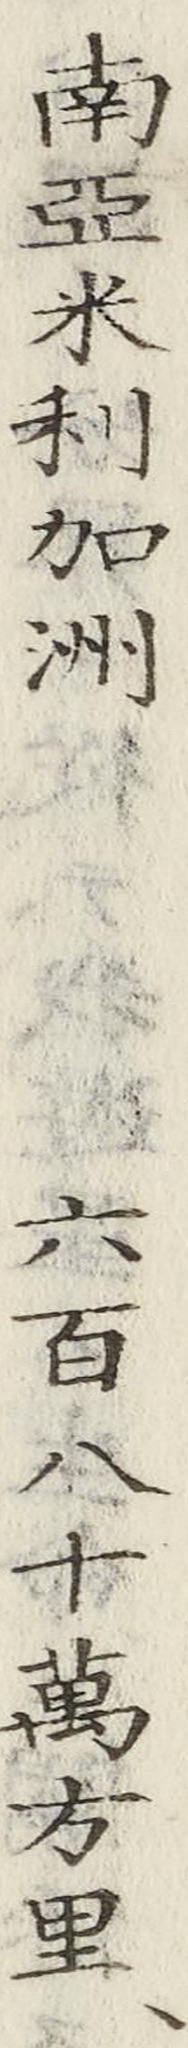南亜米利加洲六百八十万方里、
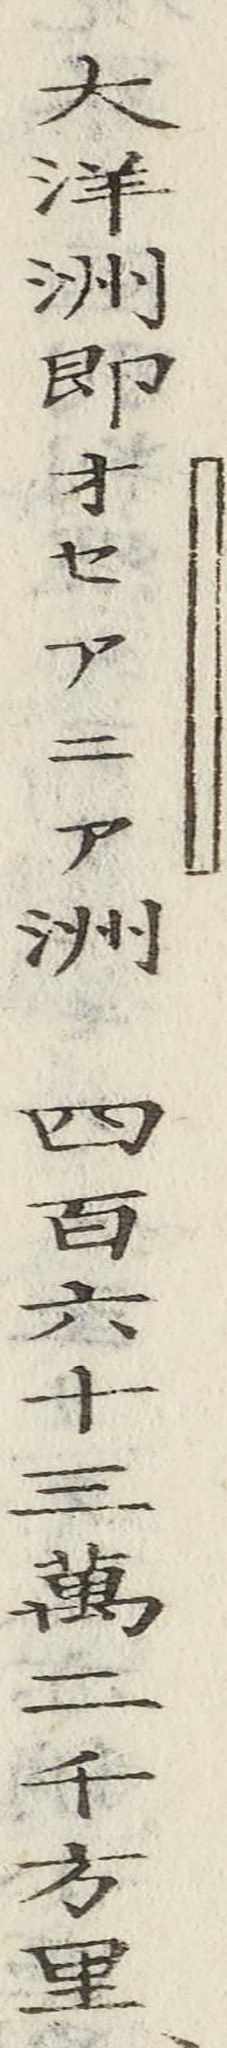大洋洲即オセアニア洲四百六十三万二千方里、
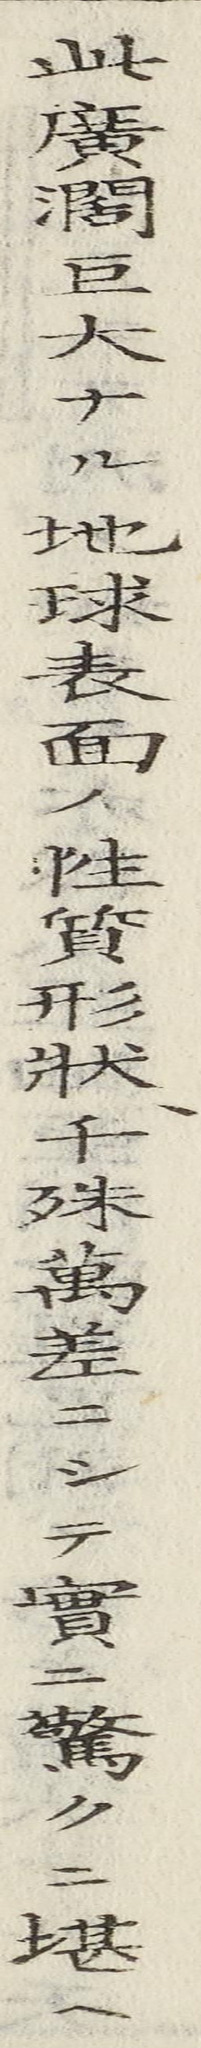此広濶巨大ナル地球表面ノ性質形状、千殊万差ニシテ実ニ驚クニ堪ヘ
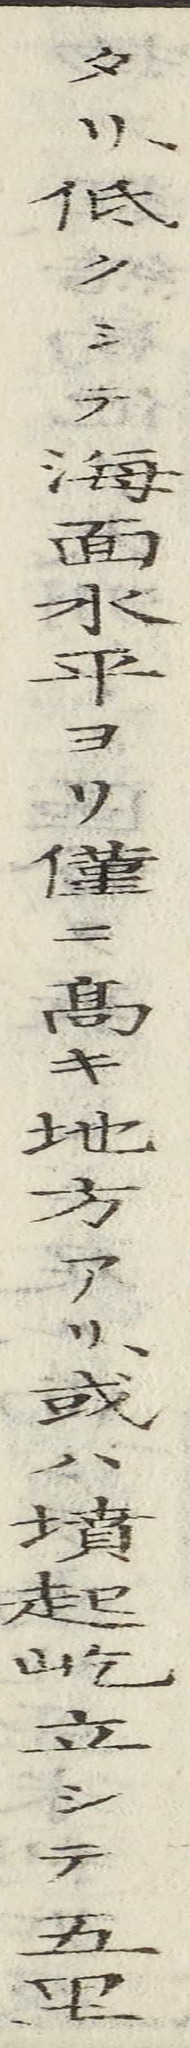タリ、低クシテ海面水平ヨリ僅ニ高キ地方アリ、或ハ墳起屹立シテ五里
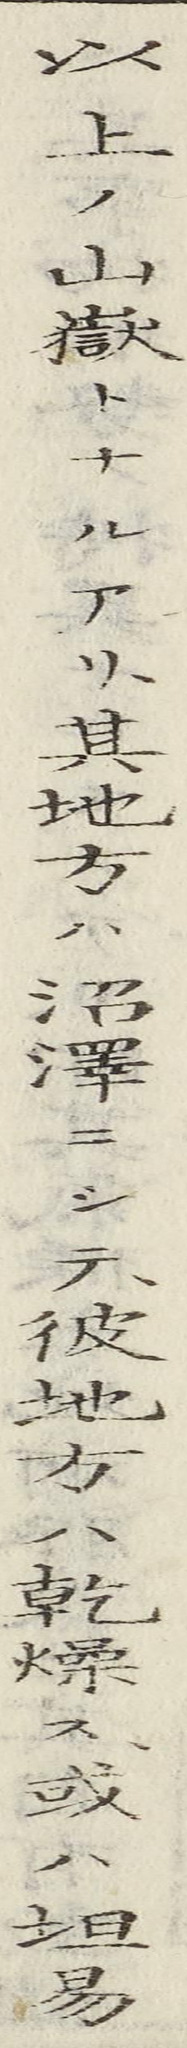以上ノ山嶽トナルアリ、其地方ハ沼沢ニシテ、彼地方ハ乾燥ス、或ハ坦易
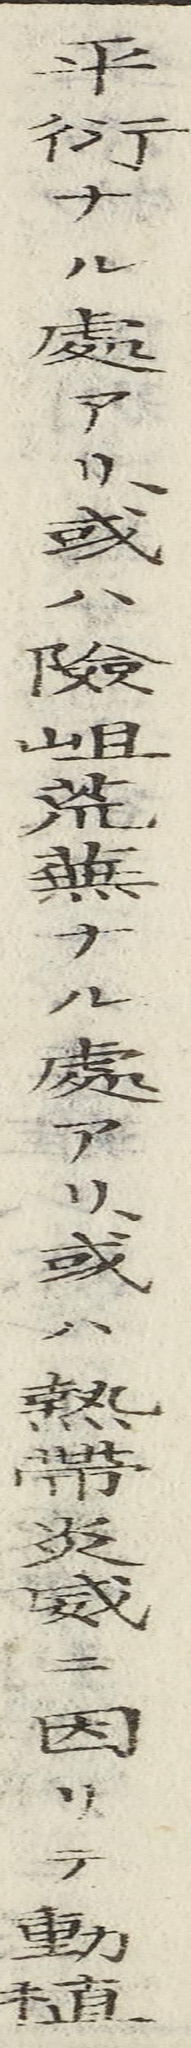平衍ナル処アリ、或ハ険岨荒無ナル処アリ、或ハ熱帯炎威ニ因リテ動植
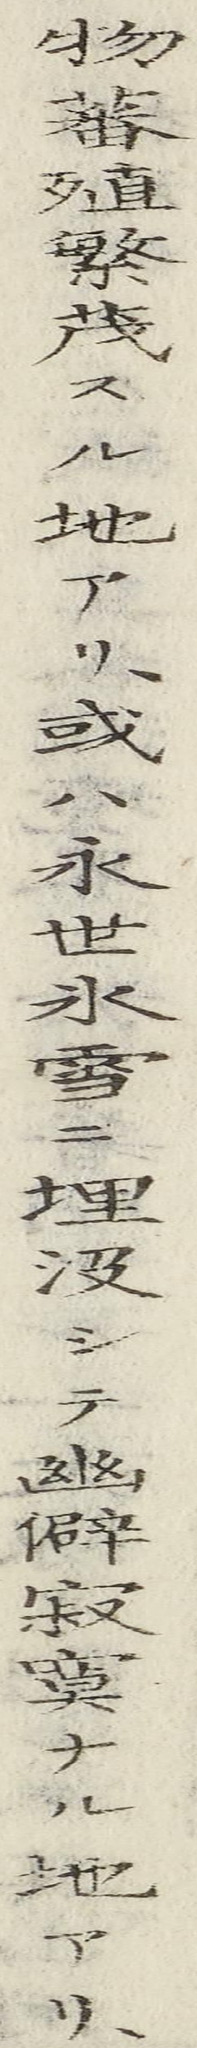物蕃殖繁茂スル地アリ、或ハ永世氷雪ニ埋没シテ幽僻寂寞ナル地アリ、
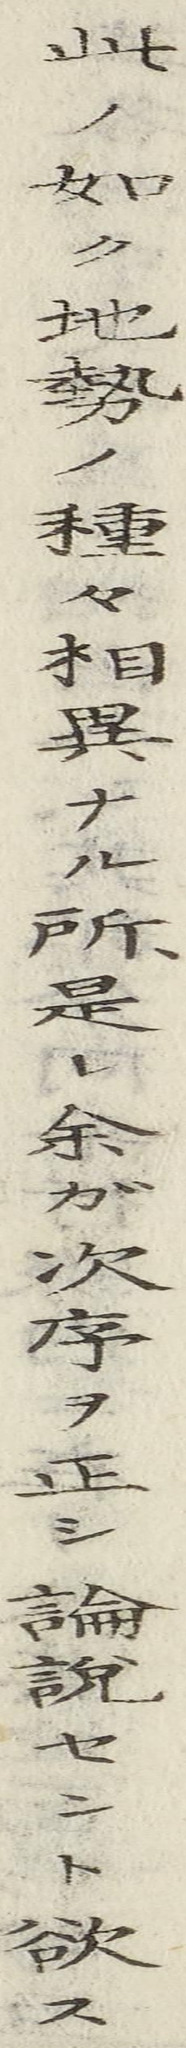此ノ如ク地勢ノ種々相異ナル所、是レ余ガ次序ヲ正シ論説セント欲ス
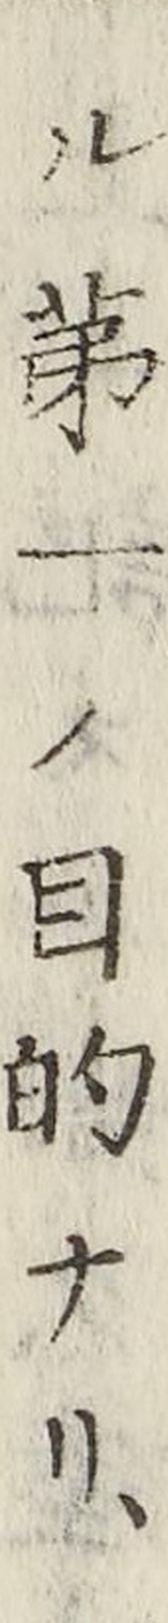ル第一ノ目的ナリ、

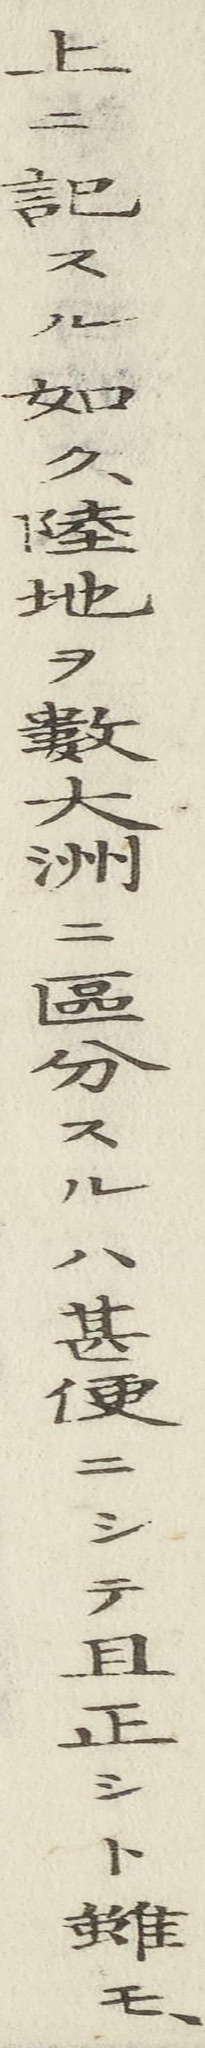上ニ記スル如ク、陸地ヲ数大洲ニ区分スルハ甚便ニシテ且正シト雖モ、
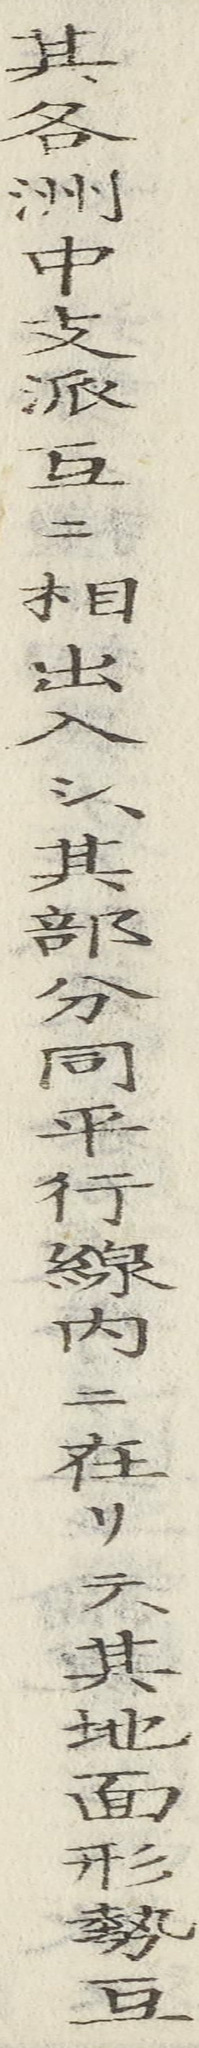其各洲中支派互ニ相出入シ、其部分同平行線内ニ在リテ、其地面形勢互
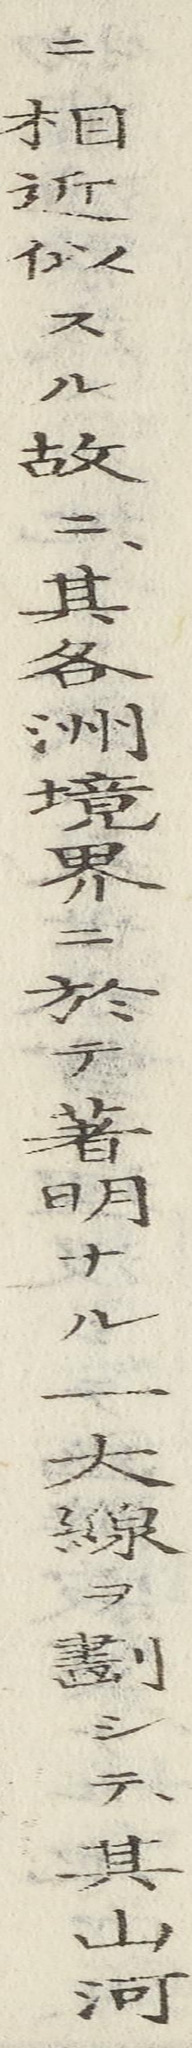ニ相近似スル故ニ、其各洲境界ニ於テ著明ナル一大線ヲ劃シテ、其山河
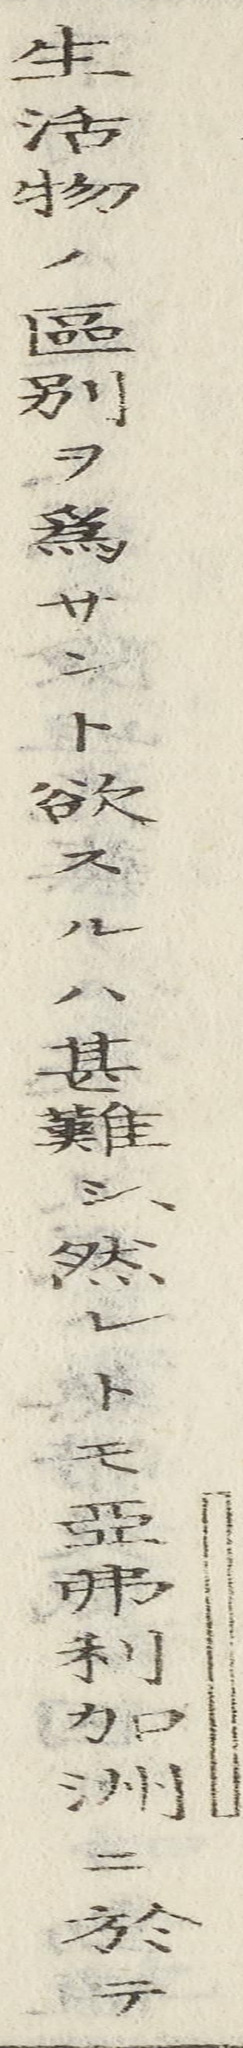生活物ノ区別ヲ為サント欲スルハ甚難シ、然レトモ阿弗利加洲ニ於テ
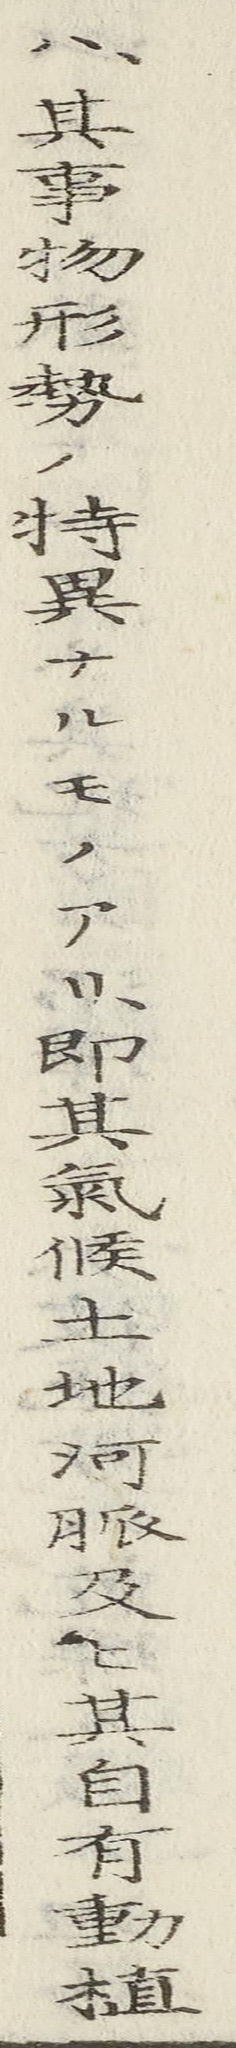ハ、其事物形勢ノ特異ナルモノアリ、即其気候土地河脈及ヒ其自有動植
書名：百科全書　地文學　全
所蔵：東京大学地震研究所図書室 Earthquake Research Institute Library, The University of Tokyo, JAPAN
